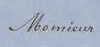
Monsieur
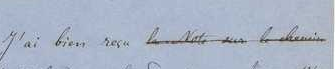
J'ai bien reçu la Note sur le chemin
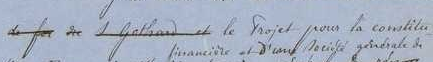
de fer du S. Gothard et le Projet pour la constitu-
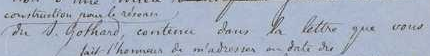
du S. Gothard, contenu dans la lettre que vous
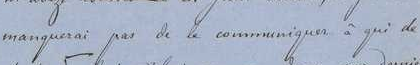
manquerai pas de le communiquer à qui de
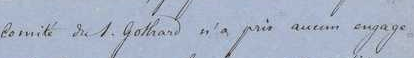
Comité du S. Gothard n'a pris aucun engage-
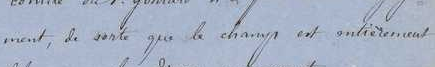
ment, de sorte que le champ est entièrement
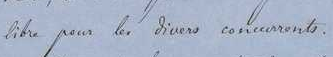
libre pour les divers concurrents.
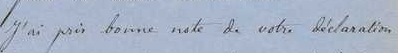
J'ai pris bonne note de votre déclaration
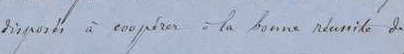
disposés à coopérer à la bonne réussite de
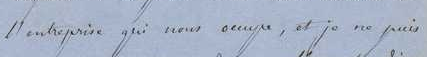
l'entreprise qui nous occupe, et je ne puis
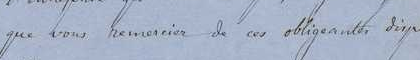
que vous remercier de ces obligeantes dispo-
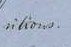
sitions.
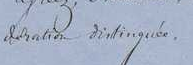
dération distinguée.
